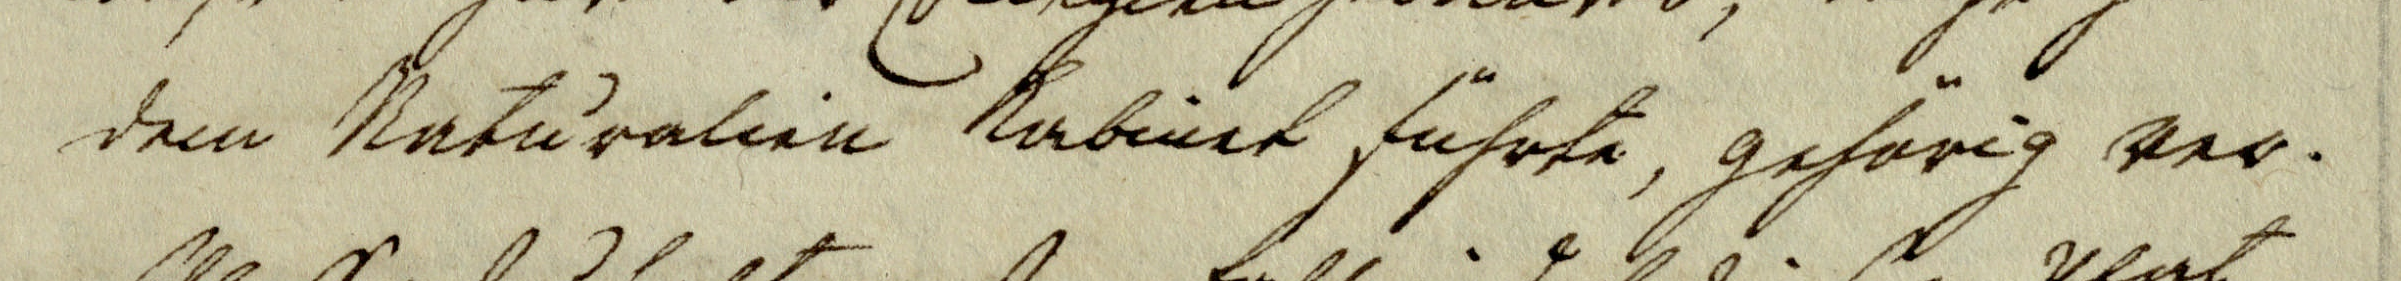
dem Naturalien Kabinet führte, gehörig ver¬
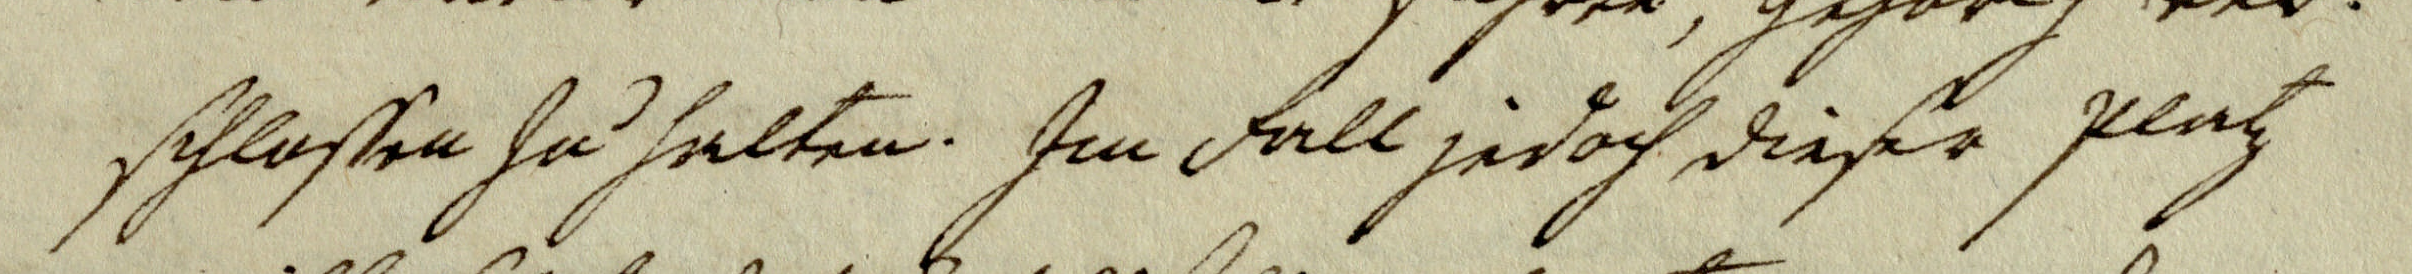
schlossen zu halten. Im Fall jedoch dieser Platz
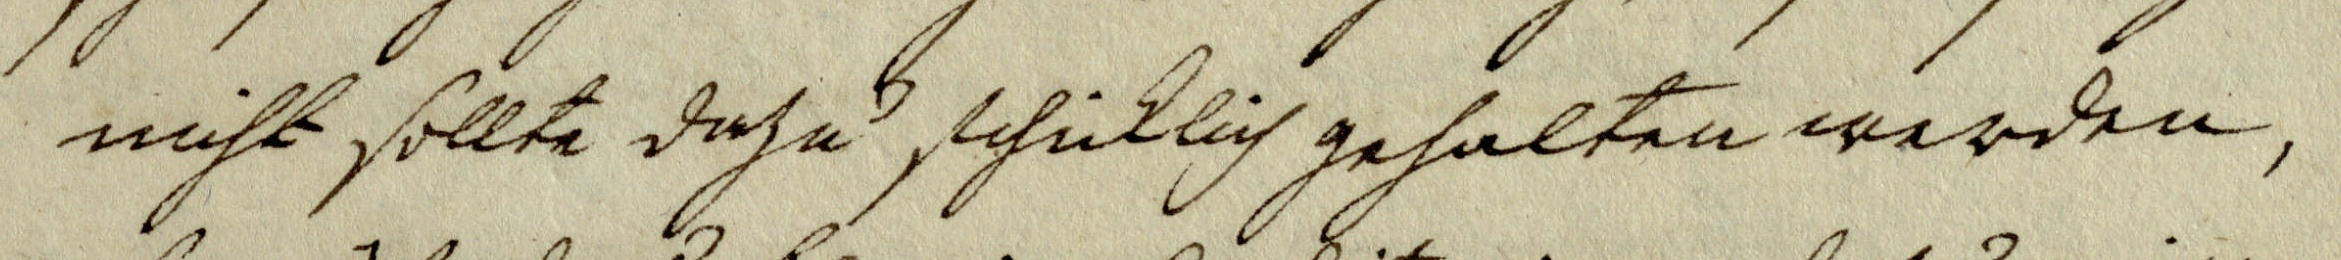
nicht sollte dazu schicklich gehalten werden,
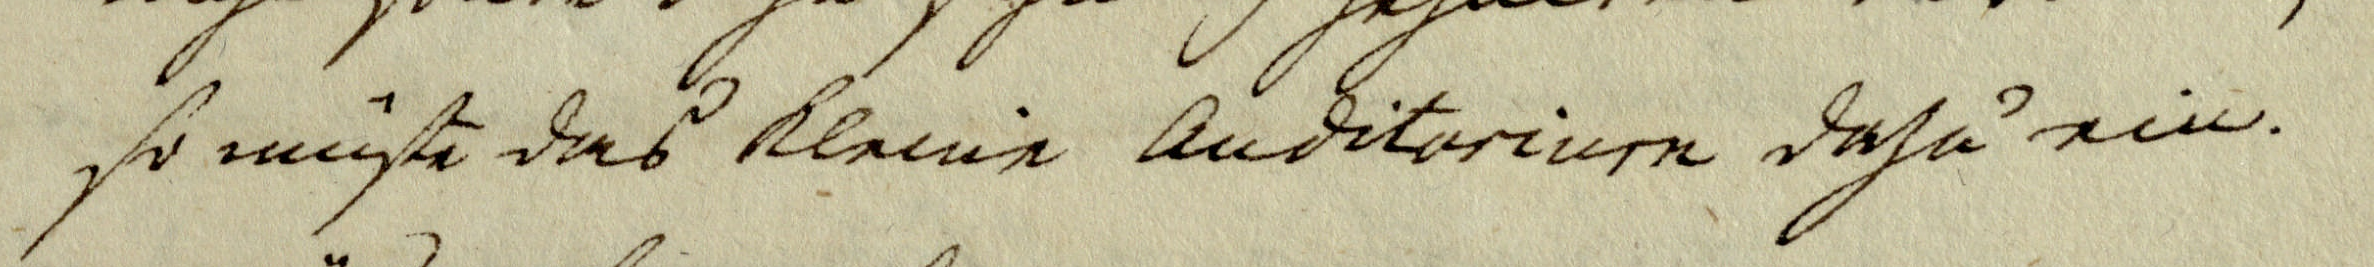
so müsse das kleine Auditorium dazu ein¬
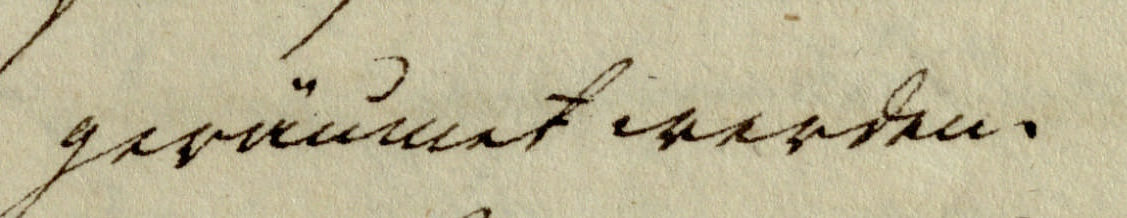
geräumet werden.
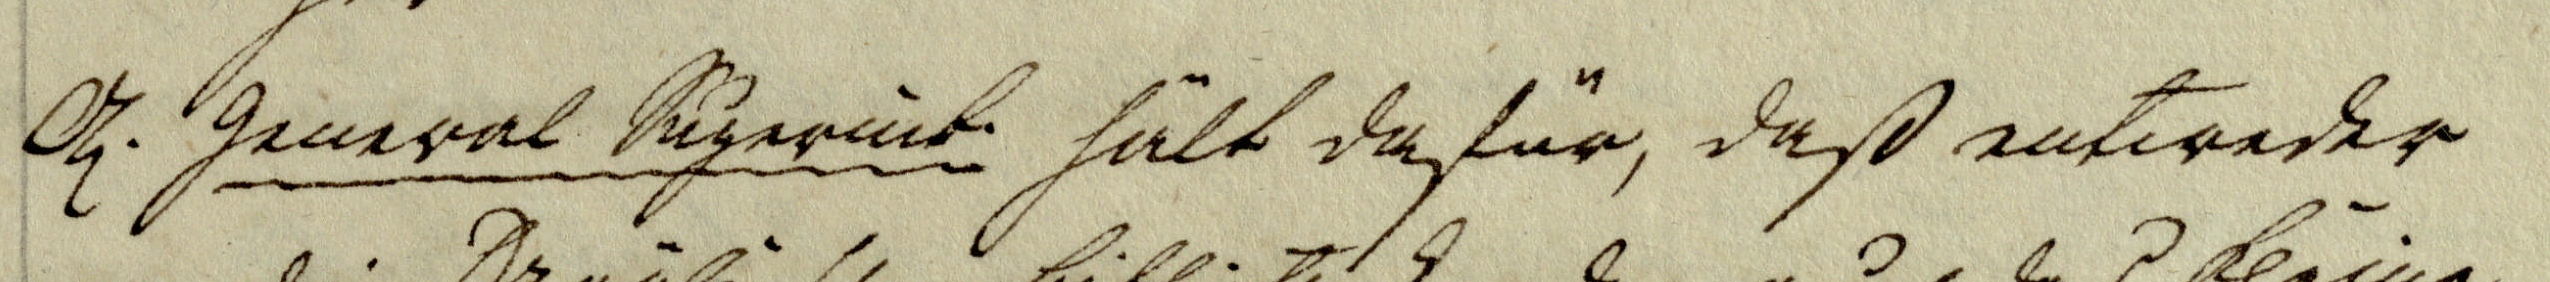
dh. General Superint. hält dafür, daß entweder
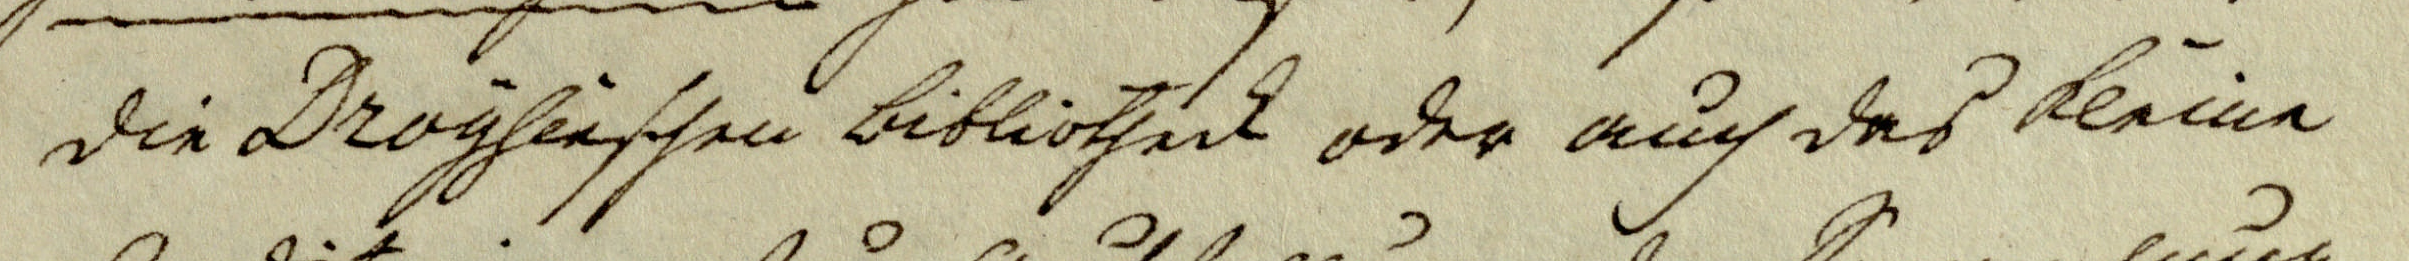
die Droÿsenschen Bibliotheck oder auch das kleine
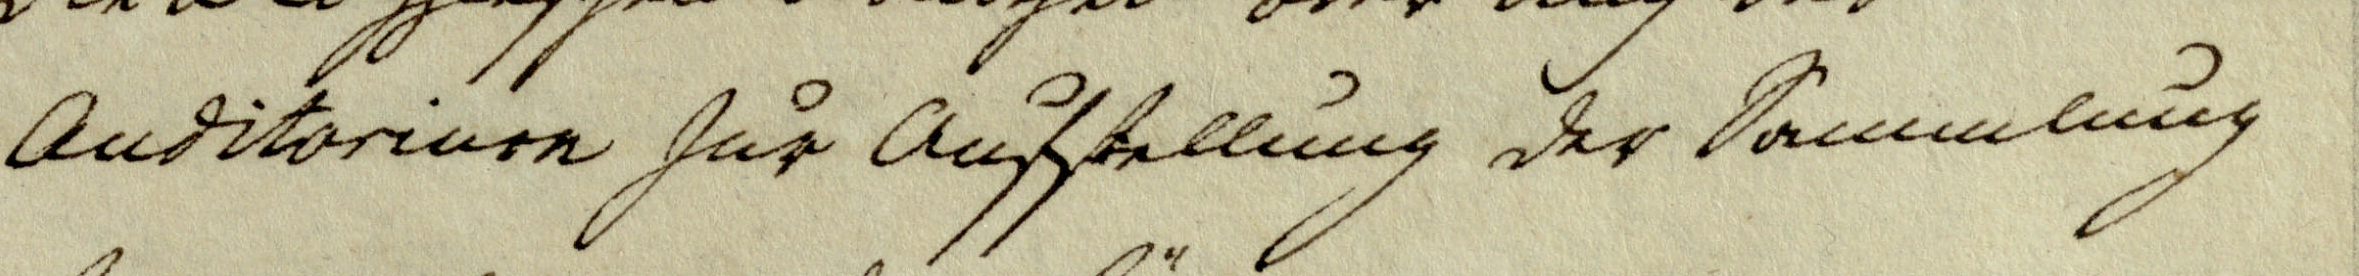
Auditorium zur Aufstellung der Sammlung
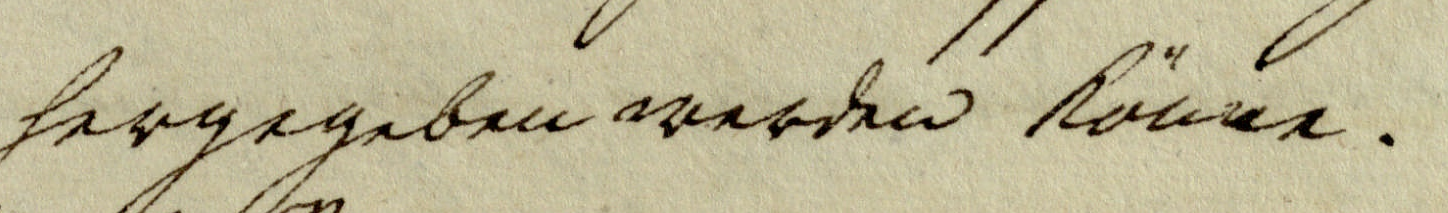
hergegeben werden könne.
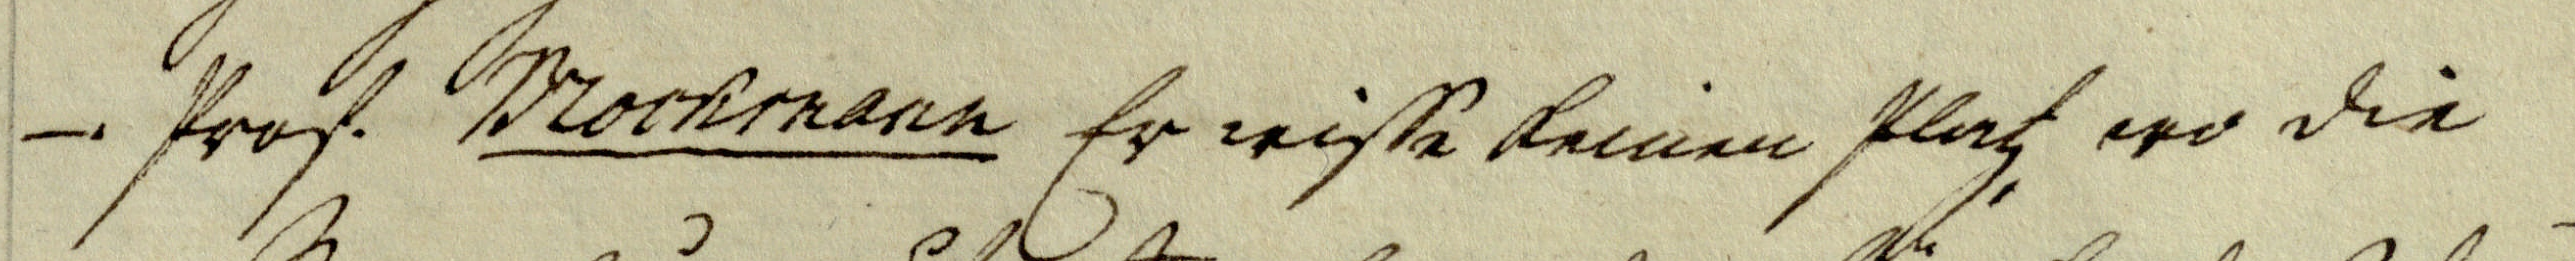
Prof. Brockmann Er wisse keinen Platz, wo die
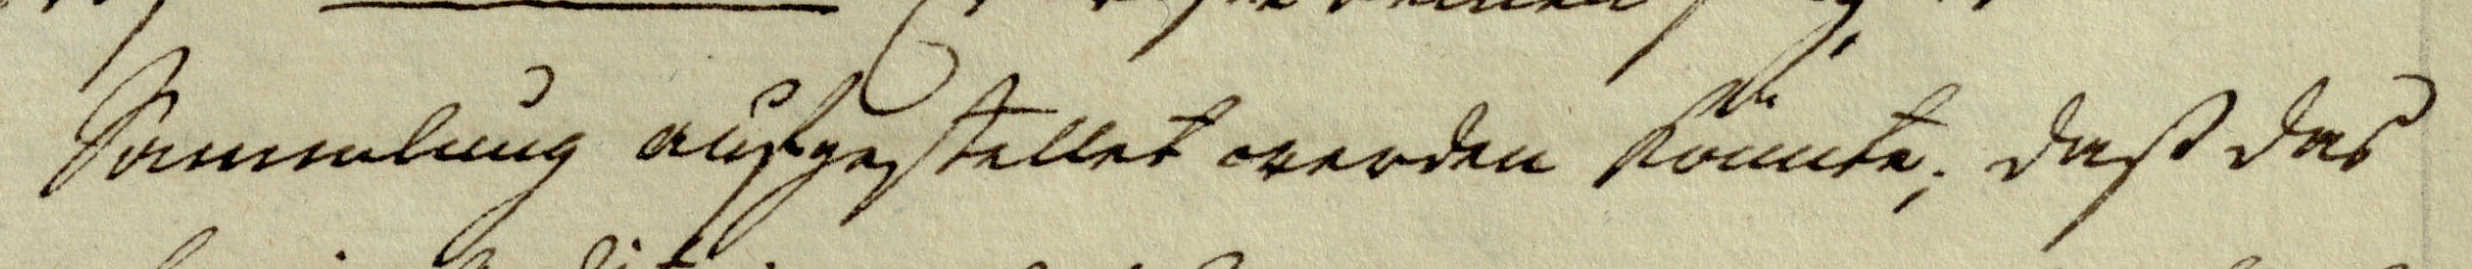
Sammlung aufgestellet werden könnte; daß das
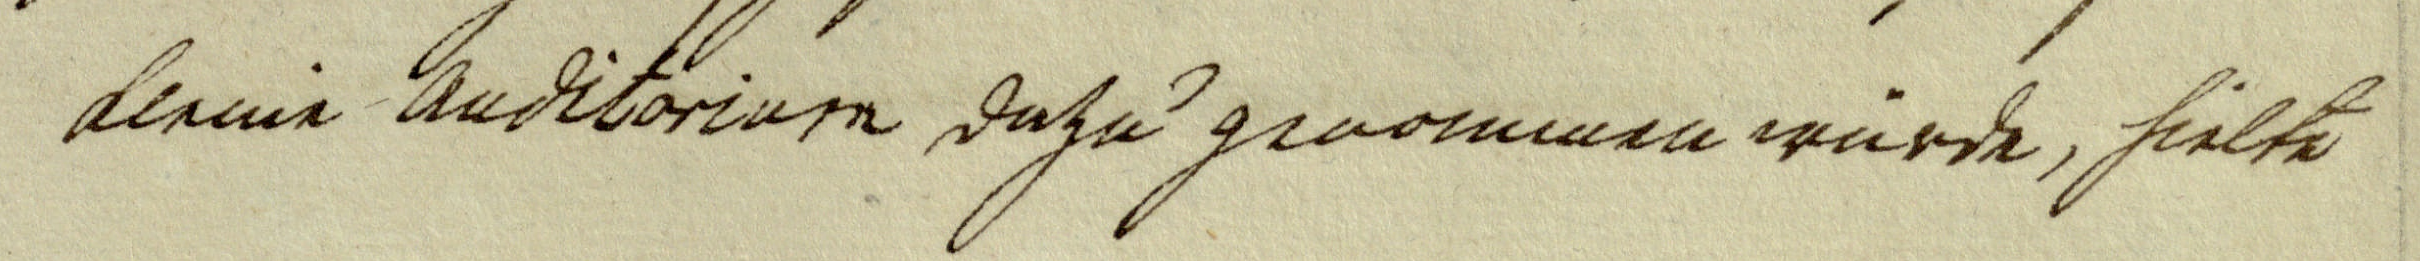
kleine Auditoriom dazu genommen würde, hielte
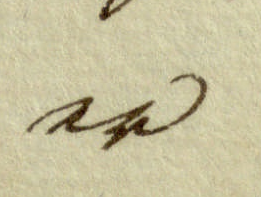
er
